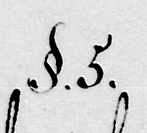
§. 5.
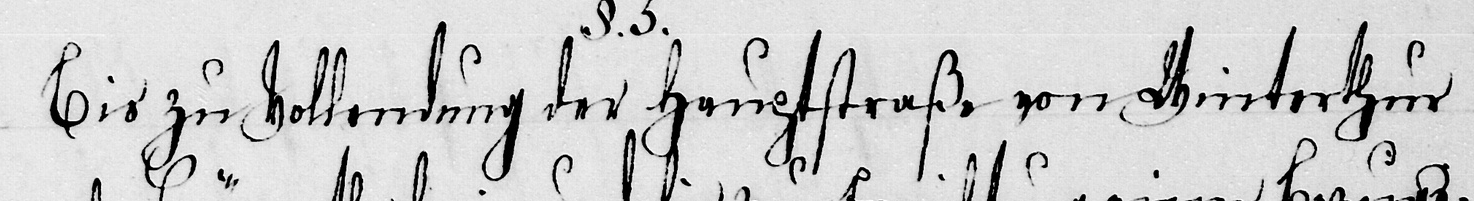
Bis zu Vollendung der Hauptstraße von Winterthur
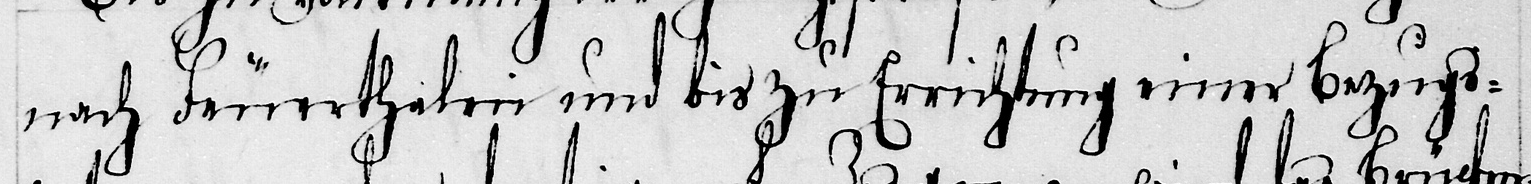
nach Feuerthalen und bis zu Errichtung einer Bezugs¬
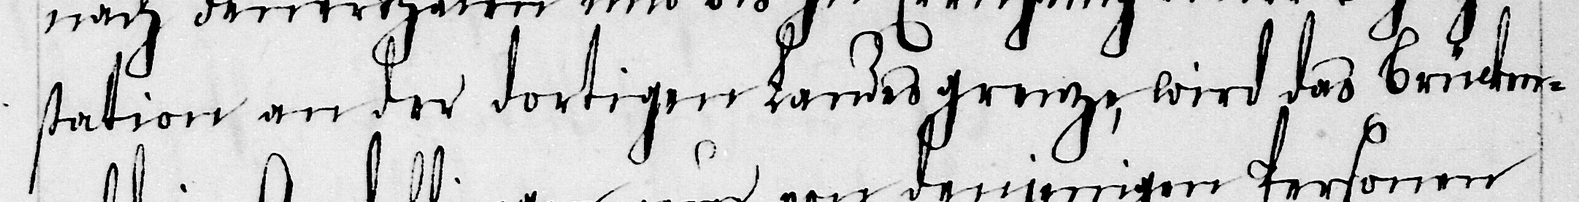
station an der dortigen Landesgrenze, wird das Brücken¬
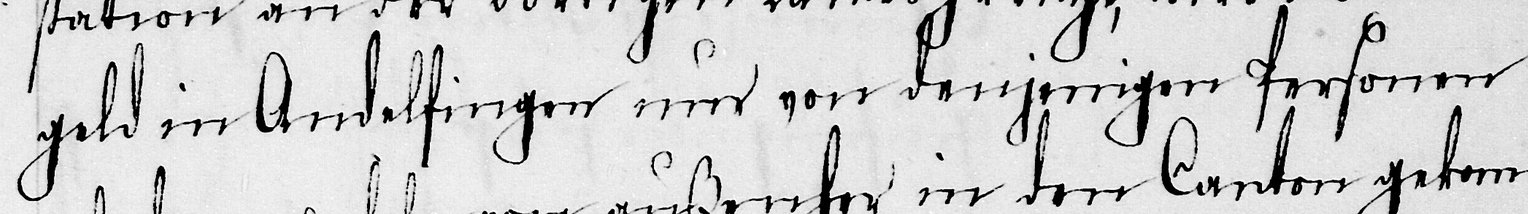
geld in Andelfingen nur von denjenigen Personen
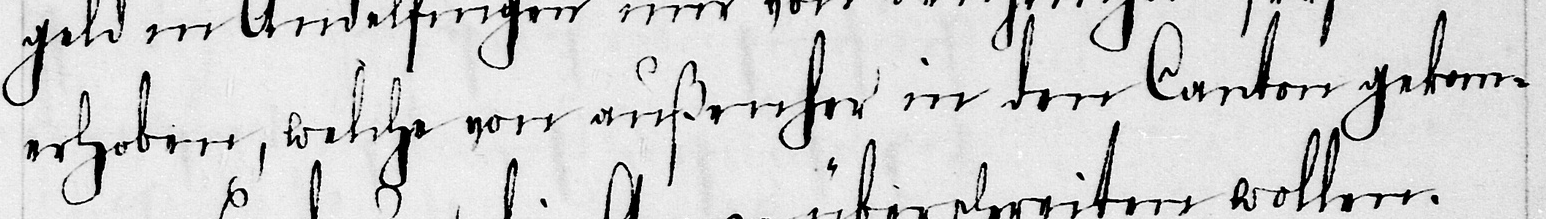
erhoben, welche von außenher in den Canton gekom¬
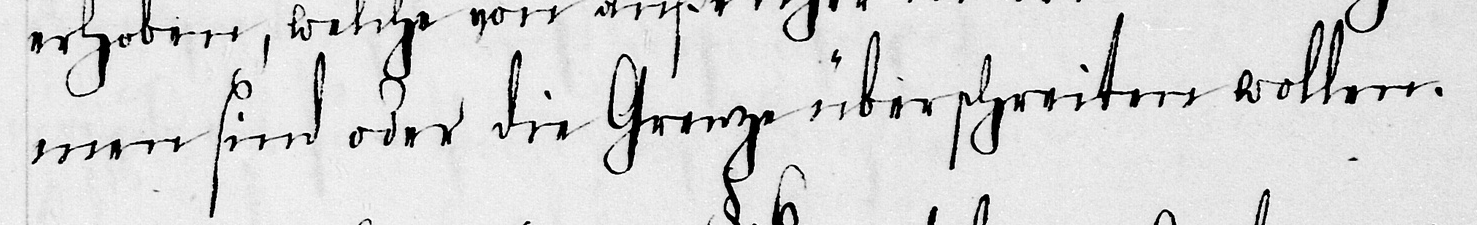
men sind oder die Grenze überschreiten wollen.
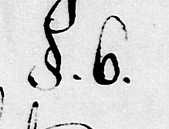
§. 6.
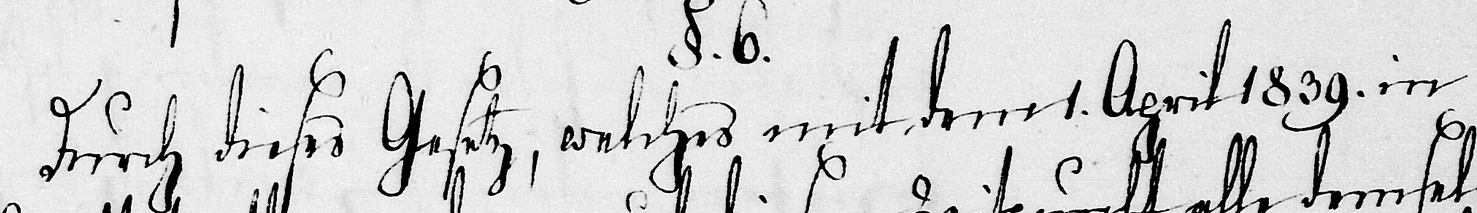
Durch dieses Gesetz, welches mit dem 1. April 1839. in
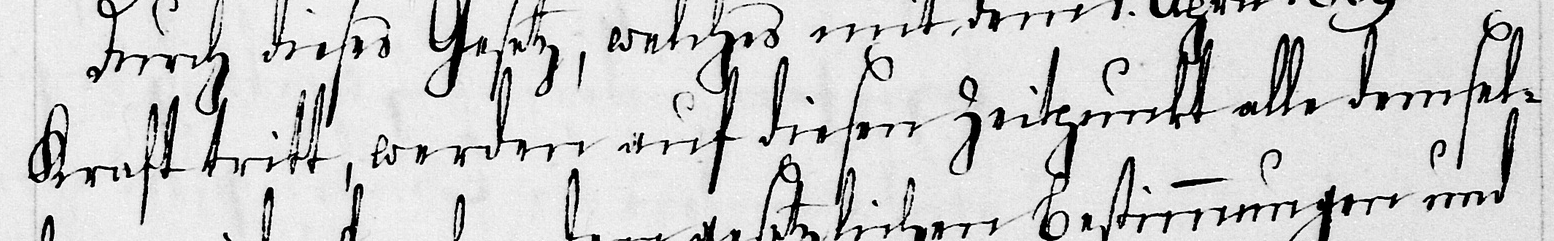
Kraft tritt, werden auf diesen Zeitpunkt alle demsel¬
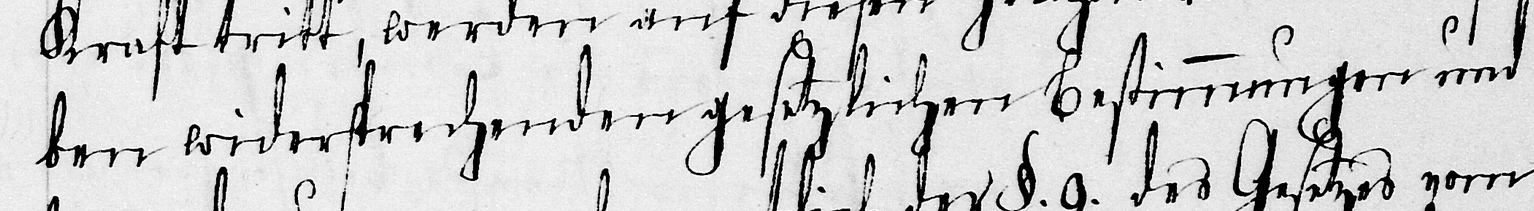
ben widersprechenden gesetzlichen Bestimmungen und
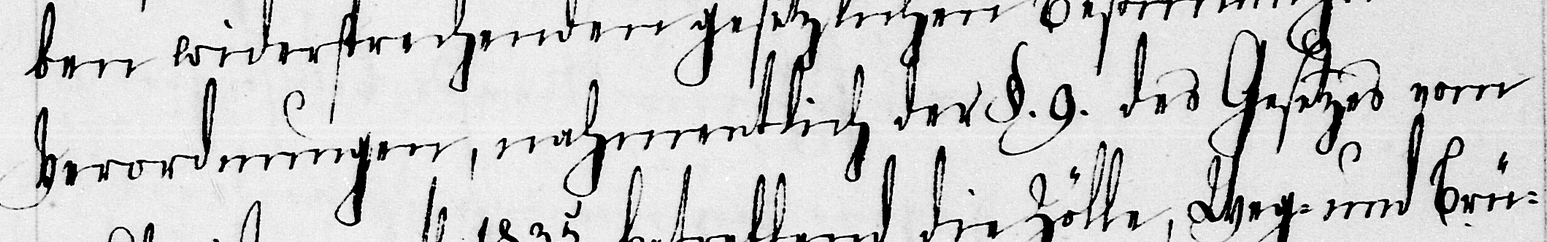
Verordnungen, nahmentlich der §. 9. des Gesetzes vom
